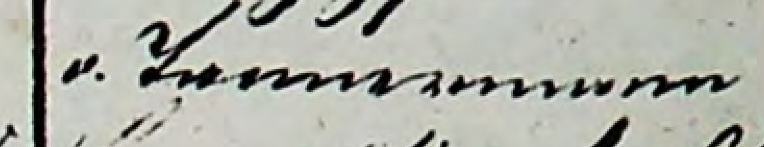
v. Tannermann
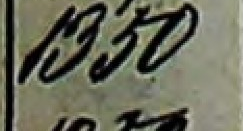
1350
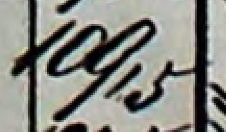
109,5
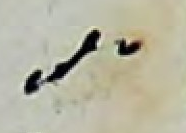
do
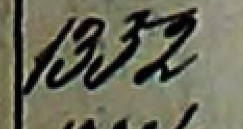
1352
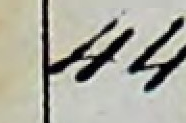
44
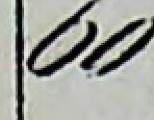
60
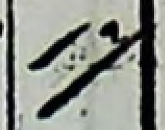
17
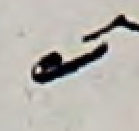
5
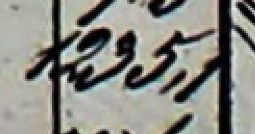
1235,1
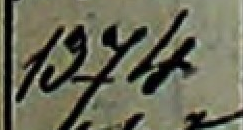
1374
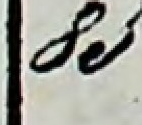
85
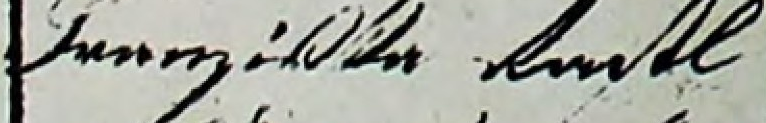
Franziska Radel
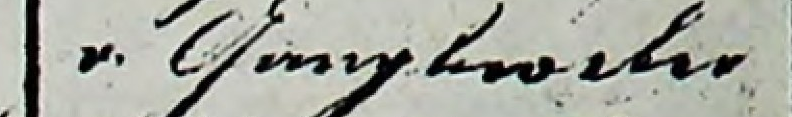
v. Gang?weber
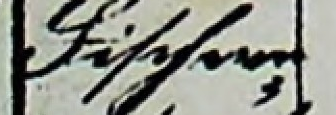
Fischer„
